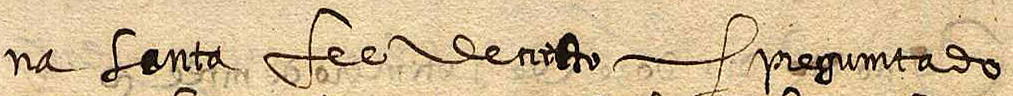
na santa fee de cristo + pregumtado
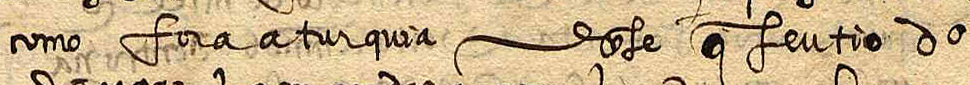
como fora a turquia dyse q̄ seu tio do
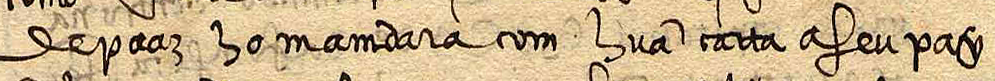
de paaz ho mamdara com huā carta a seu pay
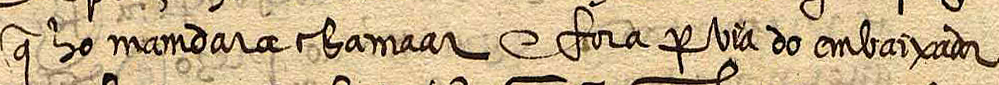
q̄ ho mamdara chamaar e fora ꝑ via do embaixador
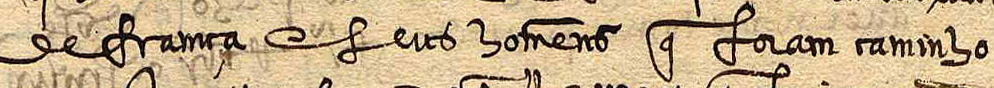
de framça e seus homēns q̄ foram caminho
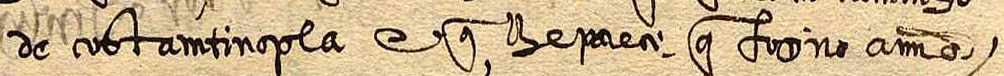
de costamtinopla e q̄ lhe parece q̄ foy no ann̄o
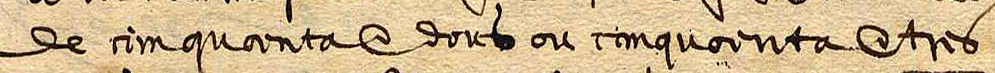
de cimquoenta e dous ou cimquoenta e tres
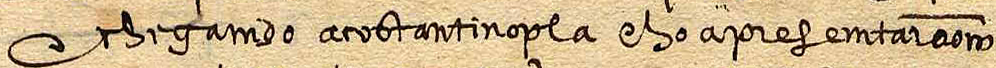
e chegamdo a costantinopla e ho apresemtaraom
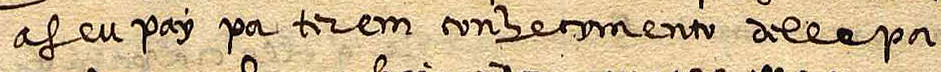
a seu pay por terem conhecymento delle por
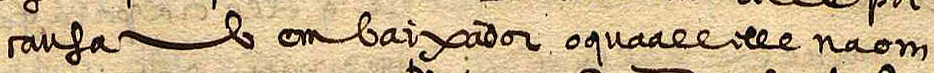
causa do embaixador o quaall elle naom
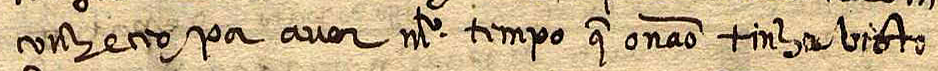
conheceo por auer mto. tempo q̄ o não tinha visto
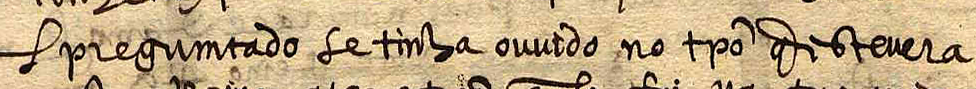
+ pregumtado se tinha ouuido no tpō q̄ esteuera
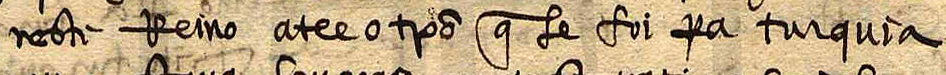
neste Reino atee o tpō q̄ se foi ꝑa turquia
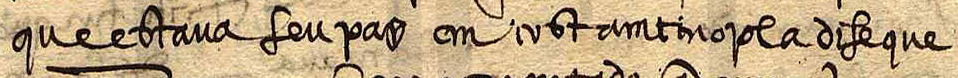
que estaua seu pay em costamtinopla dise que
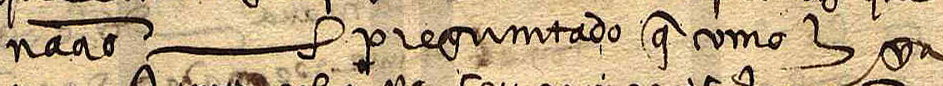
naão + pregumtado q̄ como hya
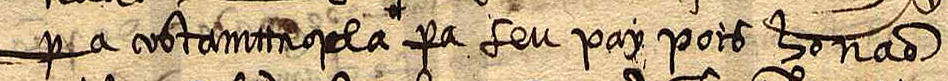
ꝑa costamtinopla ꝑa seu pay pois ho naõ
